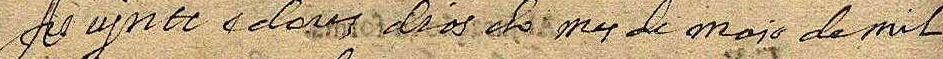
Ao vjnte e dous dias do mes de Maio de mil
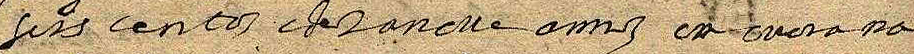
seiscentos e dezanoue annos em evora na
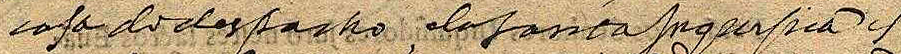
casa do despacho da Santa Jnquisicã es
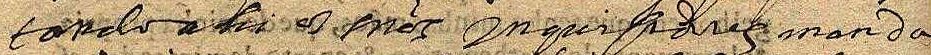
tando ahi os Snōs Jnquisidores manda
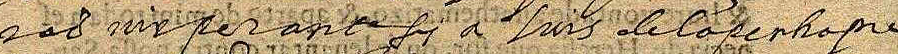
raõ vir perante sy Luis de la penha pre
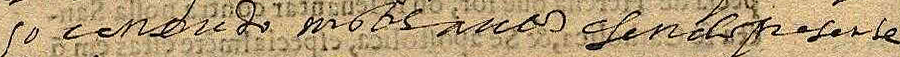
so conteudo nestes autos e sendo presente
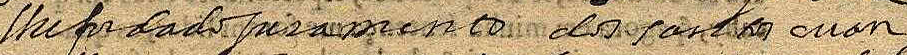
lhe foi dado Juramento dos santos euan
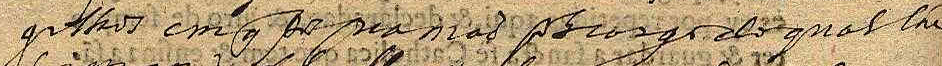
gelhos em q̄ pos sua maõ sob cargo do qual lhe
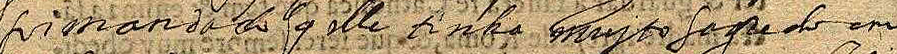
foi mandado q̄ elle tinha mujto Sagredo em
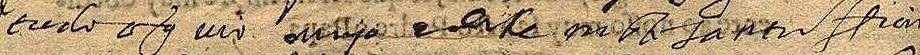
tudo o q̄ uio ouujo e disse neste Santo officio
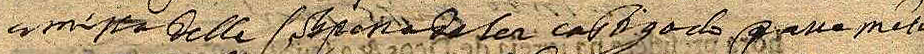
com essa delle sob pena de ser castigado grauemēte
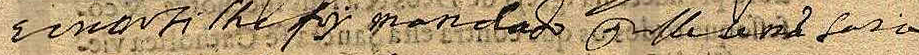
e outrosi lhe foy mandado q̄ elle se nã saia
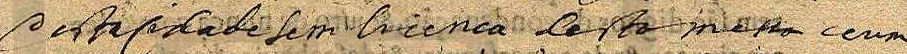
desta Cidade sem licença desta messa cum
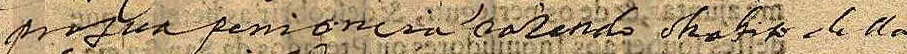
pra sua penitencia trazendo o habito della
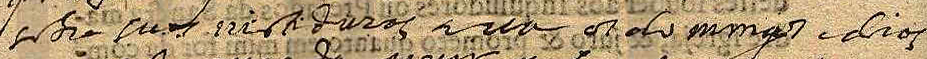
sobre suas vistiduras e ua os domingos e dias
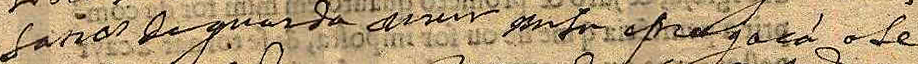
santos de guarda ouuir misa e pregaçã a Se
